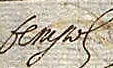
tempo
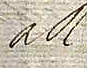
a R
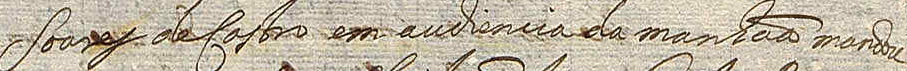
Soares de Castro em audiencia da manhaã mandou
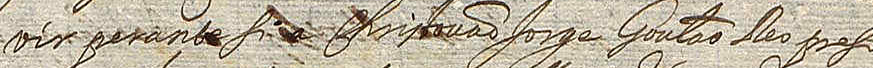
vir perante si a Christouão Jorge Goulão Reo preso
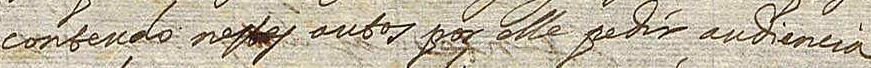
conteudo nestes autos por elle pedir audicencia,
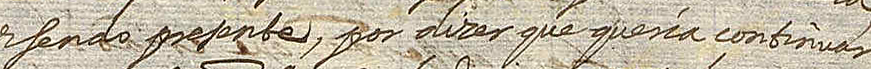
E sendo presente, por dizer que queria continuar
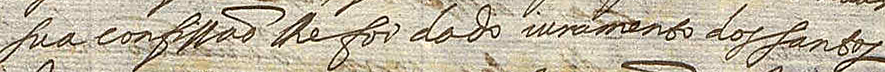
sua confissão lhe foi dado iuramento dos santos
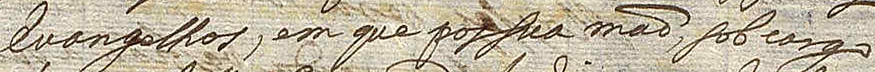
euangelhos, em que pos sua maõ, sob cargo
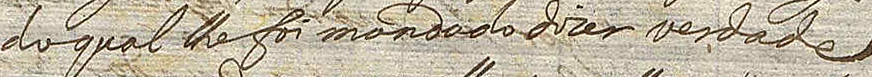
do qual lhe foi mandado dizer verdade,
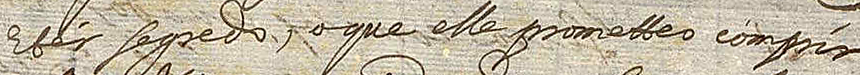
E ter segredo, o que elle prometteo comprir
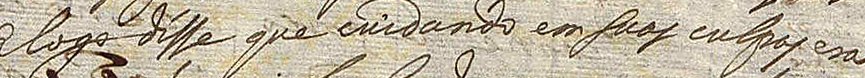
E logo disse que cuidando em suas culpas era
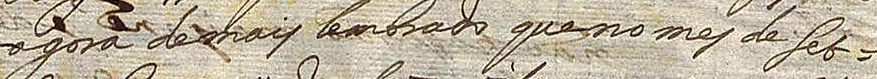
agora de mais lembrado que no mes de set
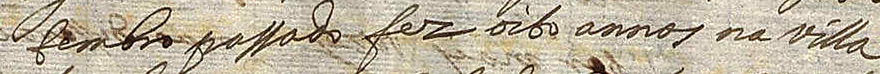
tembro passado fez oito annos na villa
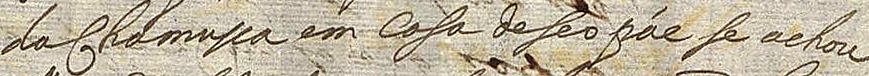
da Chamusca em Casa de seo páe se achou
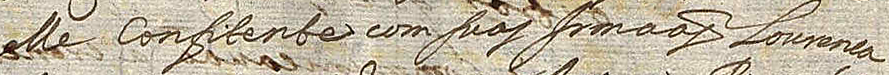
elle Confitente com suas Jrmaãs Lourença
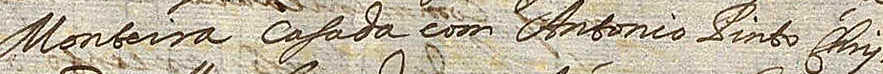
Monteira casada com Antonio Pinto Chris
